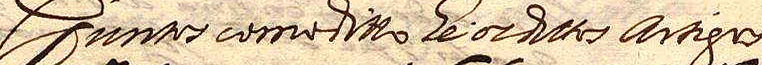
E juntos com o ditto he os dittos artigos
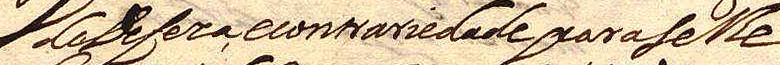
de Defeza, e contrariedade para selhe
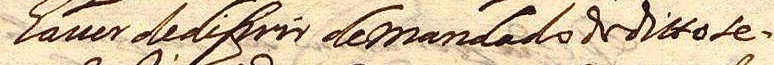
hauer de diferir de mandado do ditto se
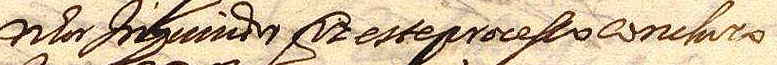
nhor Jnquisidor fiz este processo concluzo
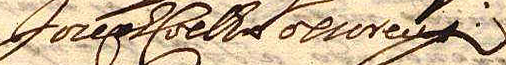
Jozeph Coelho o escreuj.
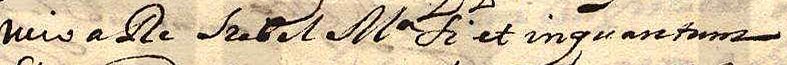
ueio a Re Izabel Ma si et in quantum
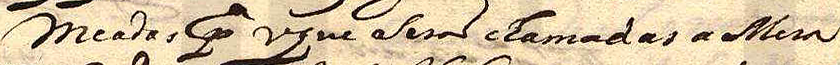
meadas pa o que seraõ chamadas a Meza
